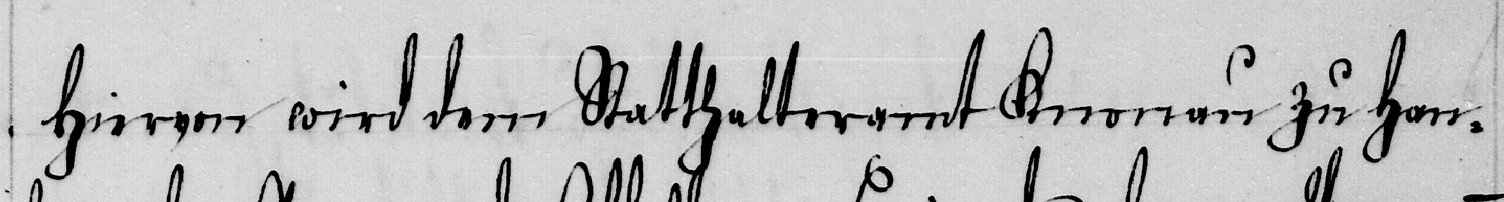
Hiervon wird dem Statthalteramt Knonau zu Han¬
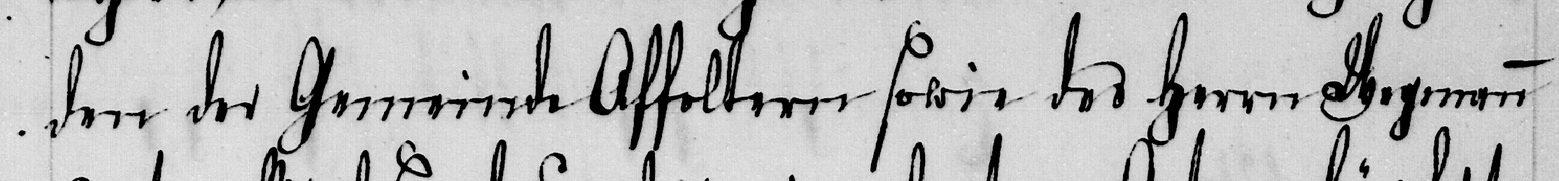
den der Gemeinde Affoltern sowie des Herrn Wegmann
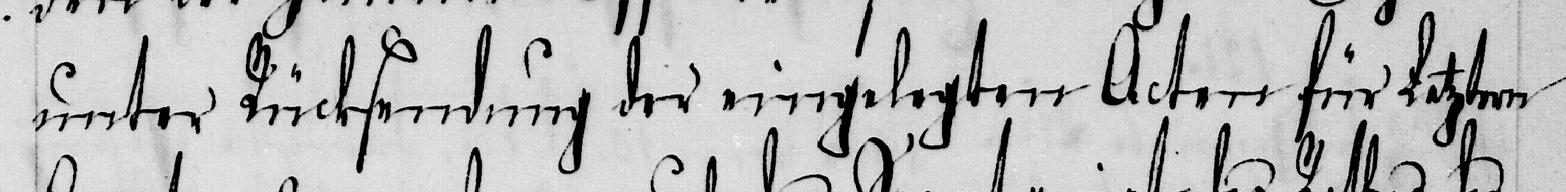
unter Rücksendung der eingelegten Acten für Letztern
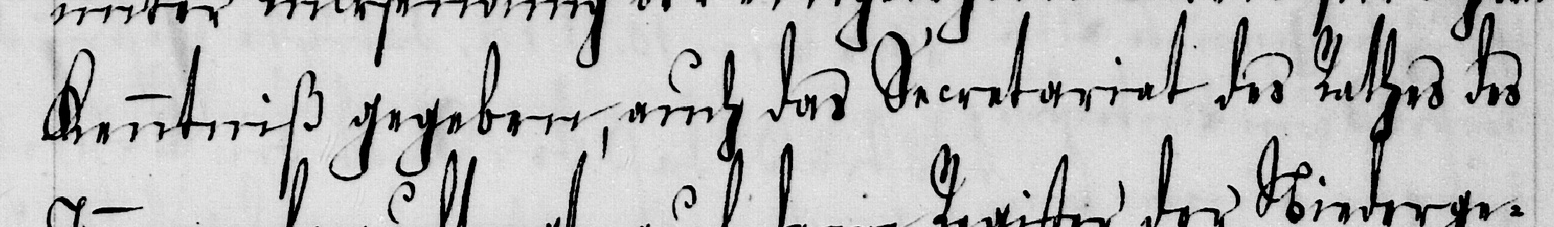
Kenntniß gegeben, auch das Secretariat des Rathes des
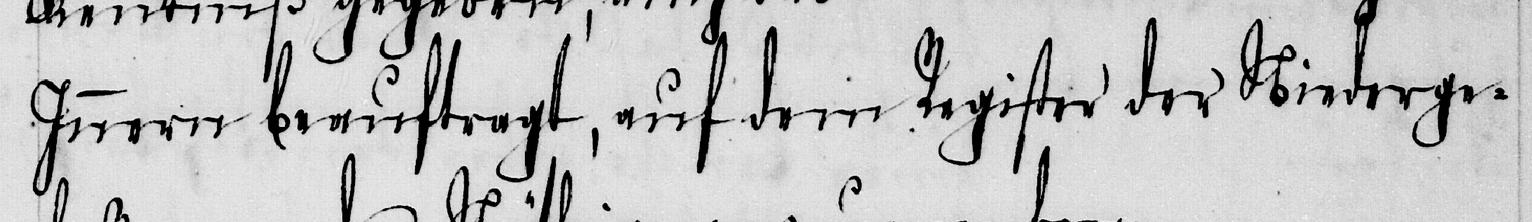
Innern beauftragt, auf dem Register der Niederge¬
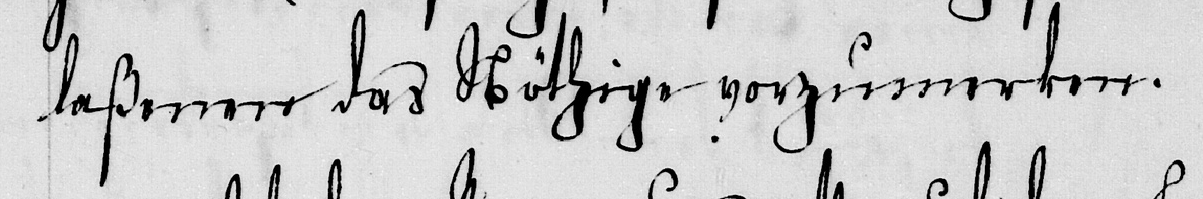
laßenen das Nöthige vorzumerken.
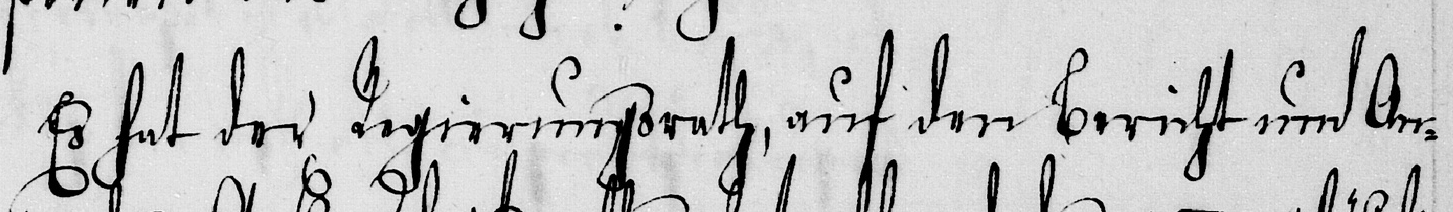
Es hat der Regierungsrath, auf den Bericht und Ant¬
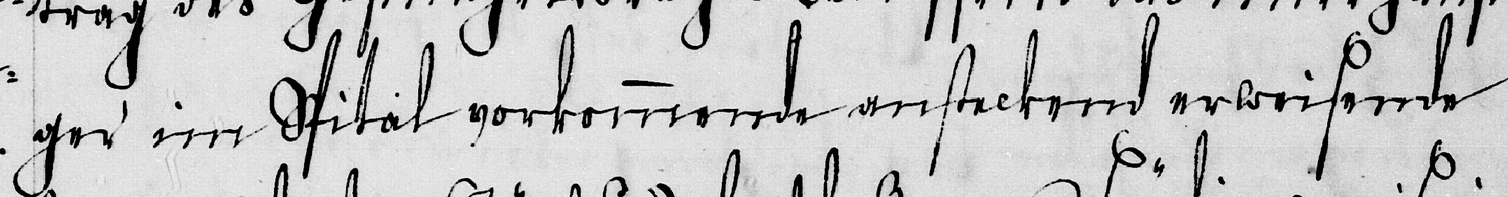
iger im Spital vorkommende ansteckend erweisende
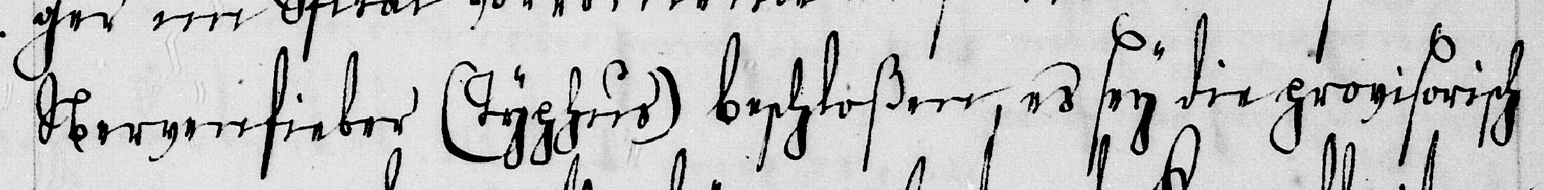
Nervenfieber (Typhus) beschloßen, es sey die provisorisch
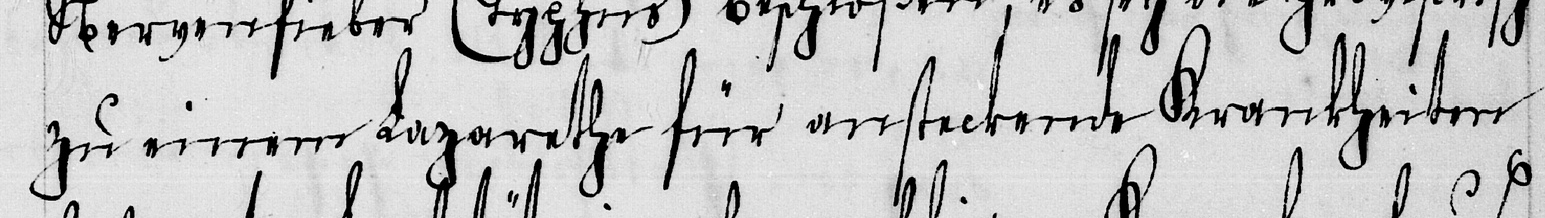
zu einem Lazarethe für ansteckende Krankheiten
